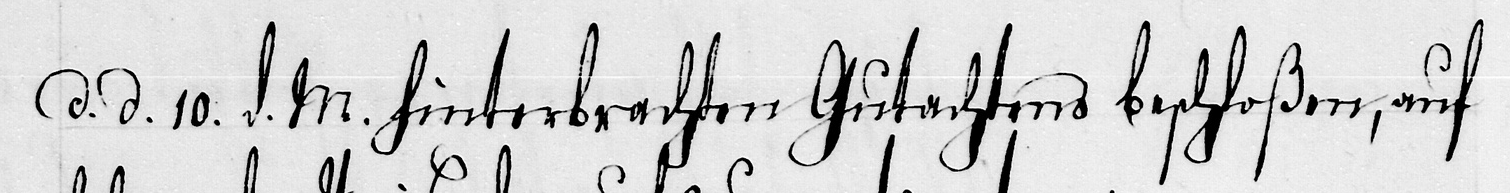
d. d. 10. d. M. hinterbrachten Gutachtens beschloßen, auf
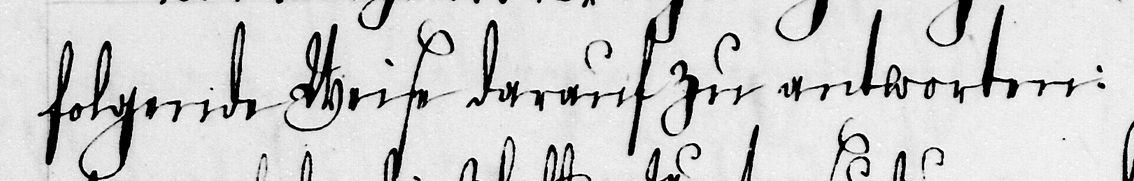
folgende Weise darauf zu antworten:
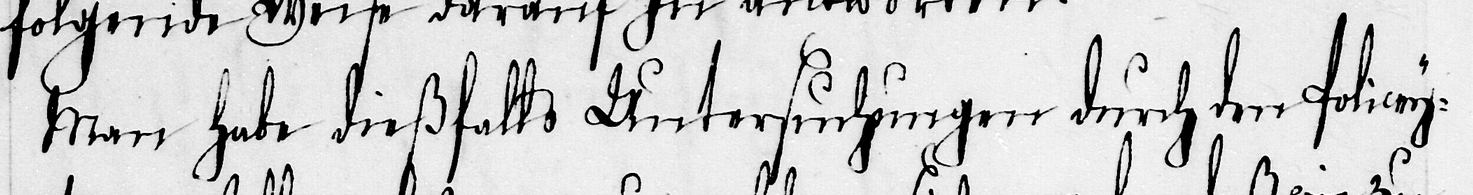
Man habe dießfalls Untersuchungen durch den Police¬
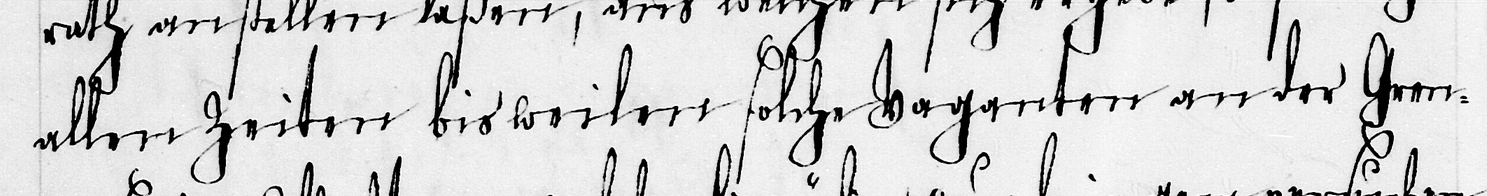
allen Zeiten bisweilen solche Vaganten an der Gren¬
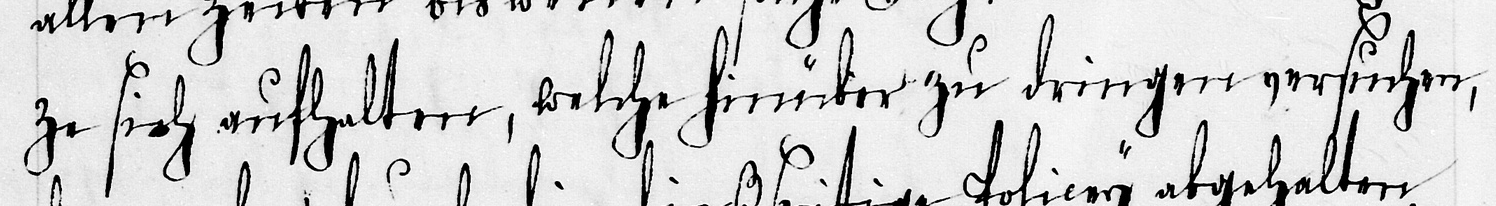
ze sich aufhalten, welche hinüber zu dringen versuchen,
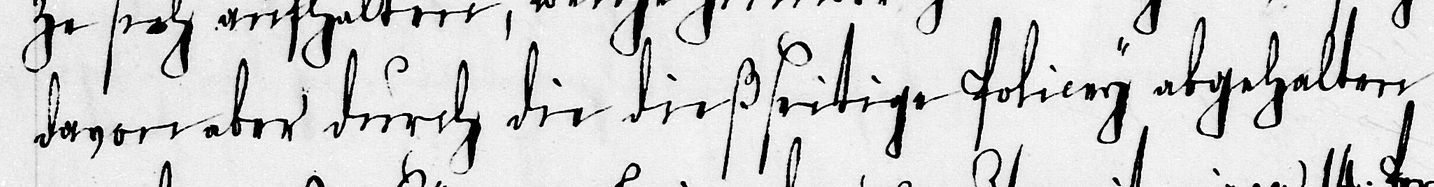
davon aber durch die dießseitige Policey abgehalten
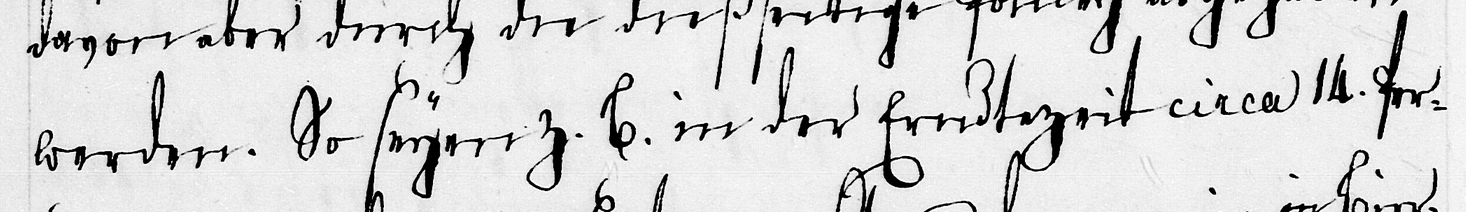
werden. So seyen z. B. in der Erndtezeit circa 14. Per¬
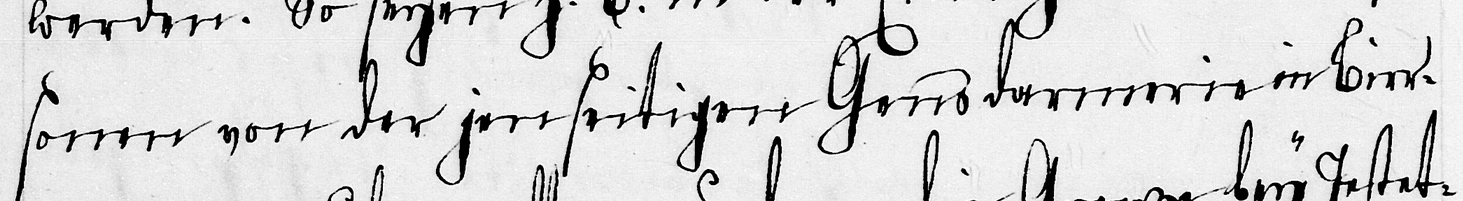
sonen von der jenseitigen Gensdarmerie in Bir¬
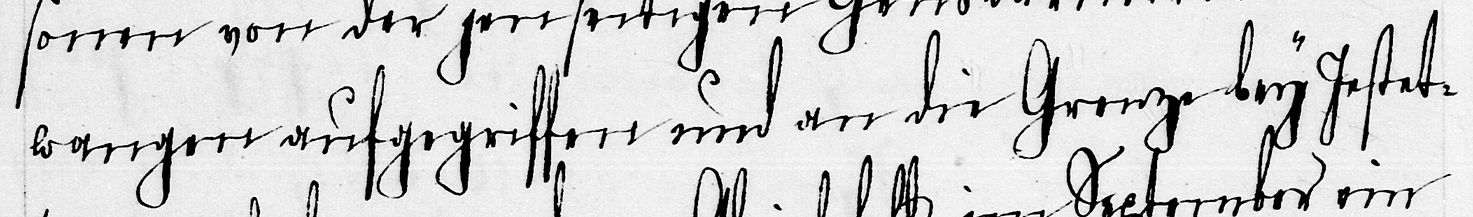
rwangen aufgegriffen und an die Grenze bey Jestet¬
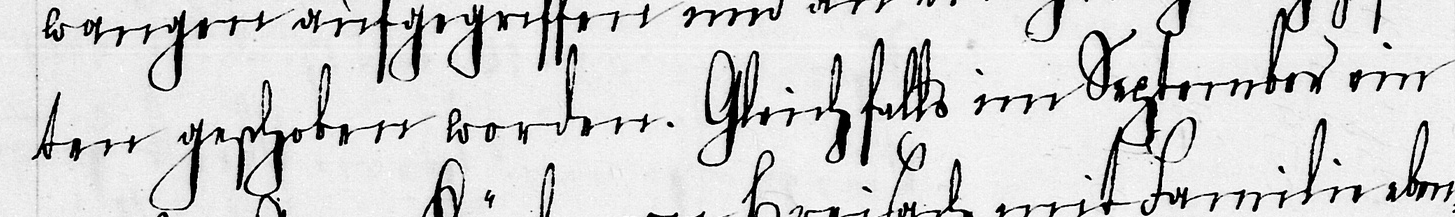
ten geschoben worden. Gleichfalls im September ein
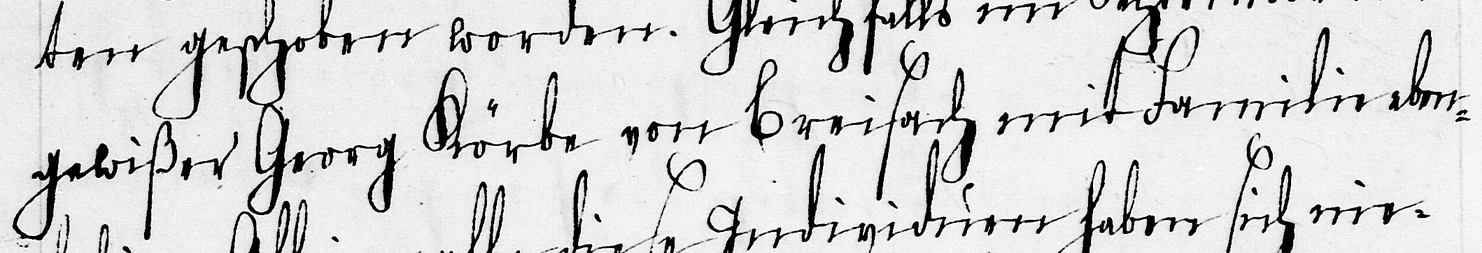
gewißer Georg Körbe von Breisach mit Familie eben¬
